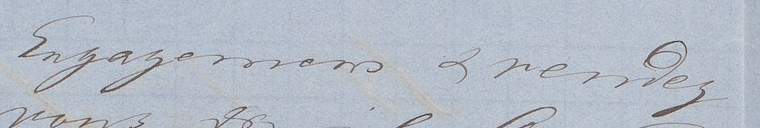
Engagemens & rendez
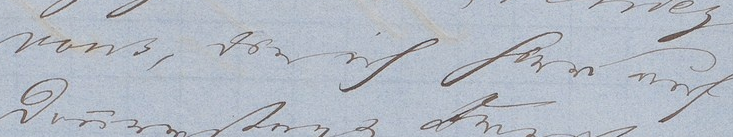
vous, die ich hier auf
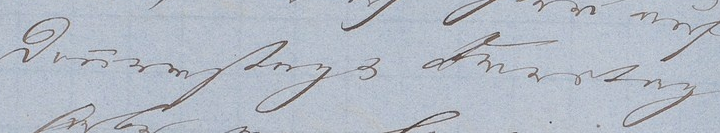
Donnerstag & Freitag
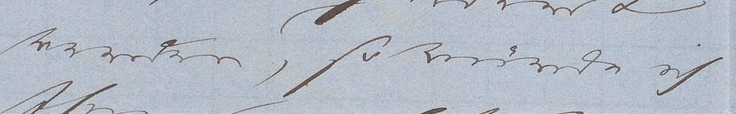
werden, so würde ich
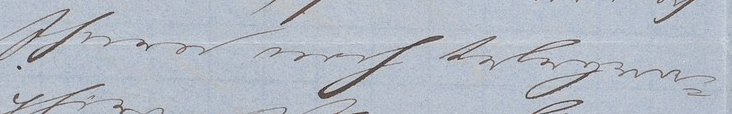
Ihnen noch telegra-
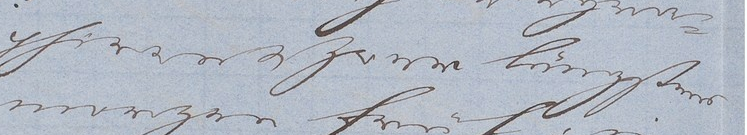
phiren & zwar längstens
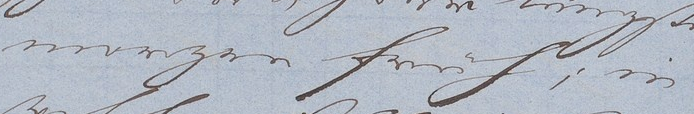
morgen früh; in
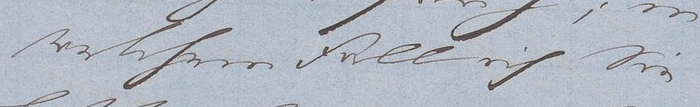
welchem Fall ich Sie
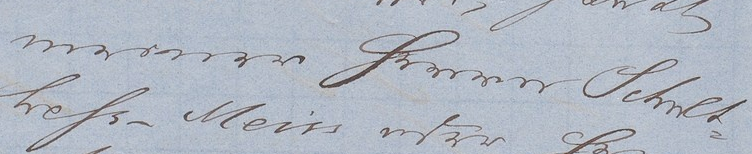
meiner Herrn Schult-
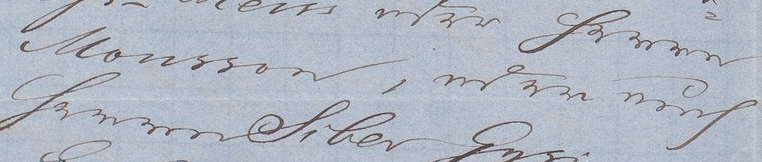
Mousson, oder auch
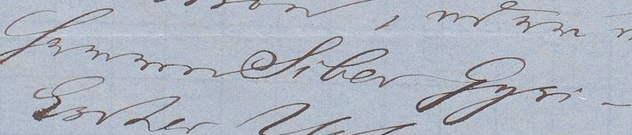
Herrn Siber Gysi –
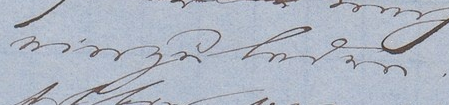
einzuladen. –
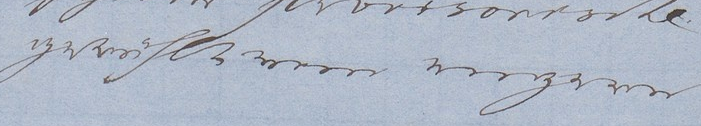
gewählt vom engern
